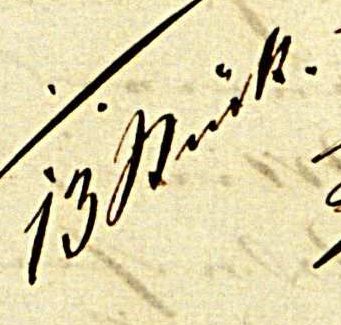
13 Stück
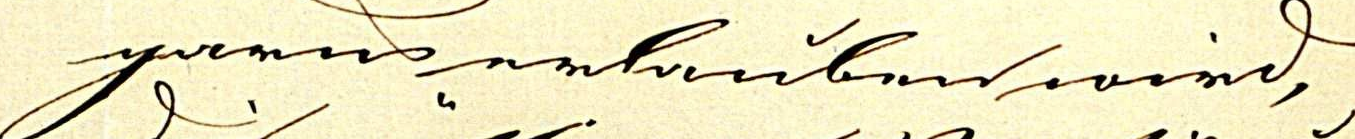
garns erlauben wird,
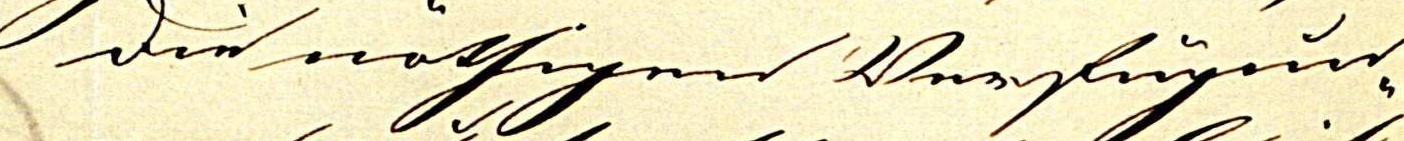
die nöthigen Verfügun¬
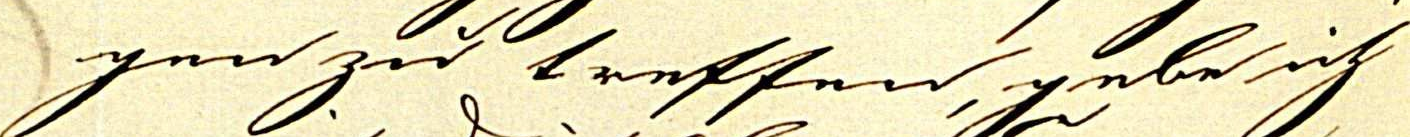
gen zu treffen, gebe ich
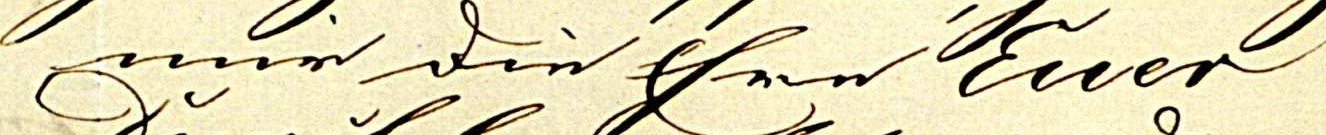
mir die Ehre Euer
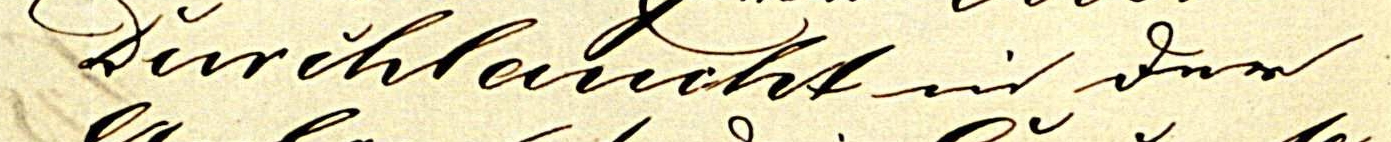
Durchlaucht in der
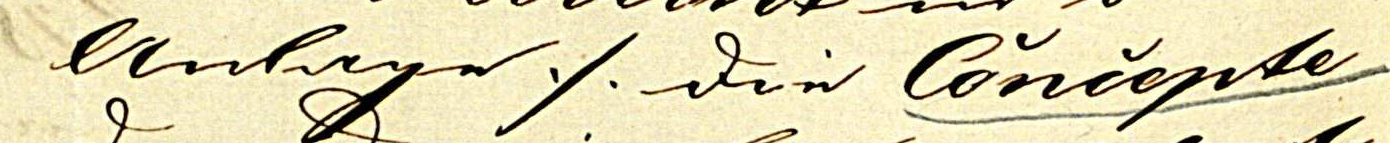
Anlage ./. die Concepte
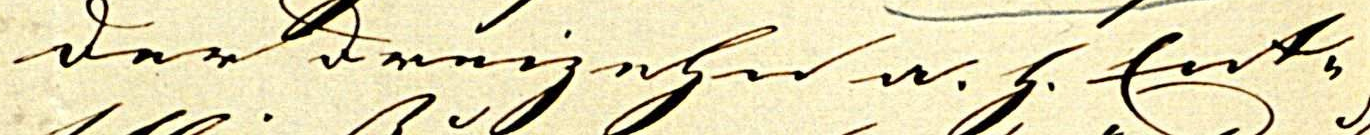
der dreizehn a. h. Ent¬
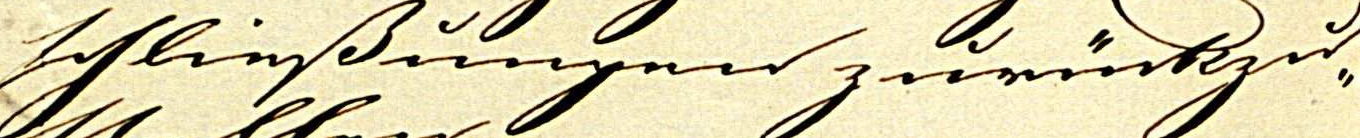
schließungen zurückzu¬
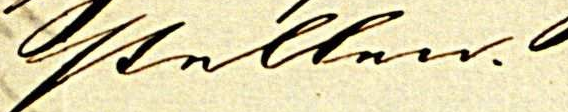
stellen.
